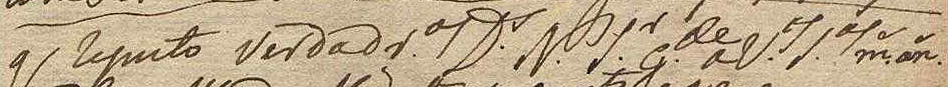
q̄ Reputo verdadr.as D.s N.s S.r g.de a V.s S.as m.s an.s
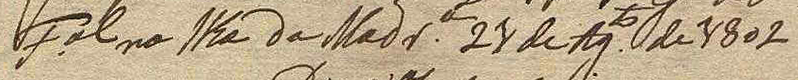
F.al na lha da Madr.a 21 de Ag.to de 1802
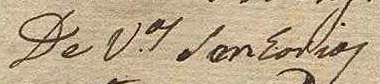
De V.as Senhorias
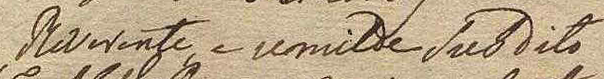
Reverente, e umilde subdito
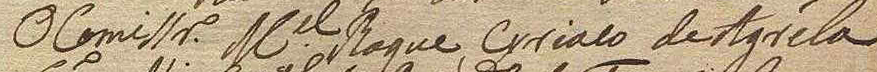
O Comissr.o M.el Roque Cyriaco de Agréla
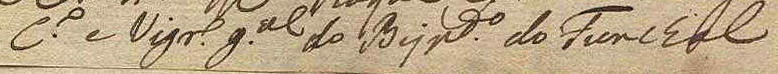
C.o e Vigr.o g.al do Bisp.do do Funchal
